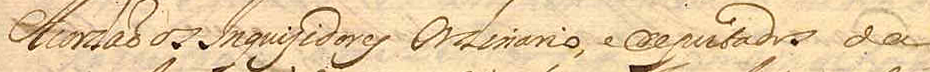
Acordão os Inquizidores Ordinario, e deputados da
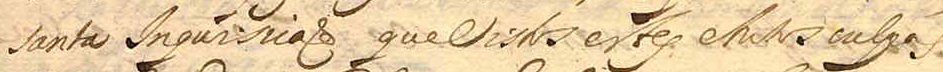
santa Inquisicaõ que vistos estes Autos culpas
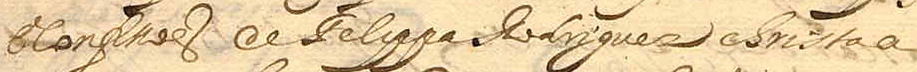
E Confissoẽs de Felippa Rodriguez christaa
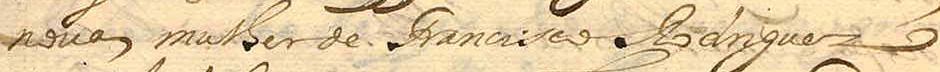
noua mulher de Francisco Rodriguez
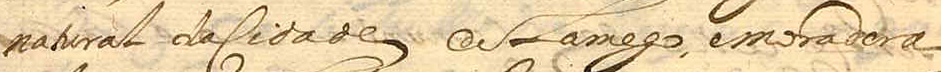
natural da Cidade de Lamego, e moradora
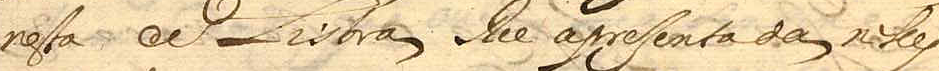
nesta de Lisboa Ree aprezentada nestes
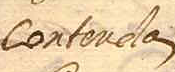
conteuda
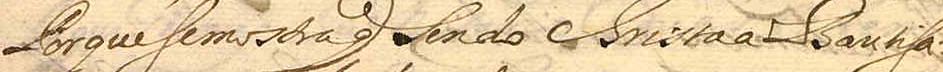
Porque se mostra q̅ Sendo christaa Bautisa
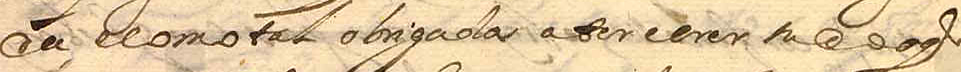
da, e como tal obrigada a ter e crer tudo o q̅
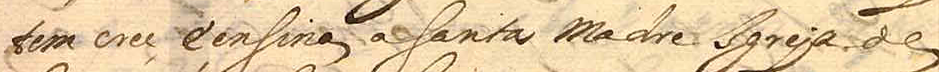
tem cree, e ensina a santa madre Igreja de
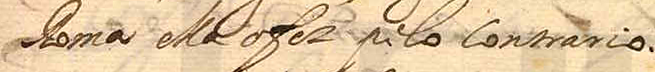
Roma ella o fez pelo contrario.
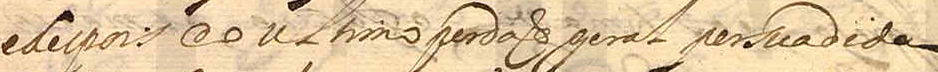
e depois do ultimo perdaõ geral persuadida
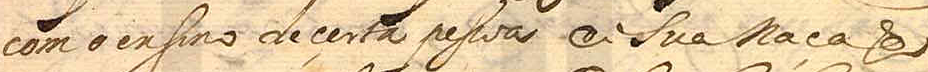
com o ensino de çerta pessoa de sua naçaõão
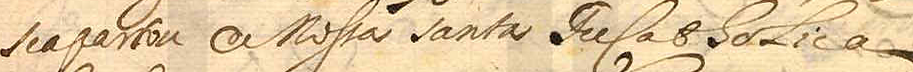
se apartou de nossa santa Fee Catholica
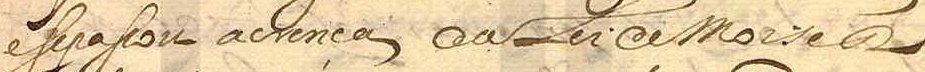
e se passou a crença da Lei de Moises
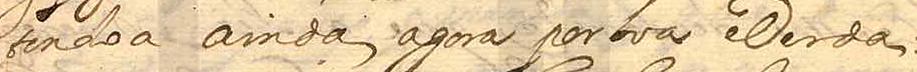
tendo a ainda agora por boa e Verda
